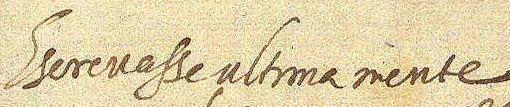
Escreuasse ultimamente
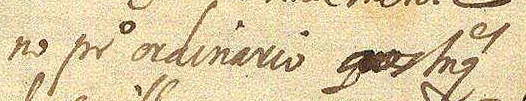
no pro ordinario aos Inqes
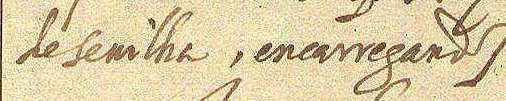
de seuilha, encarregandos
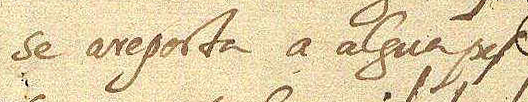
se a reposta a algua pes
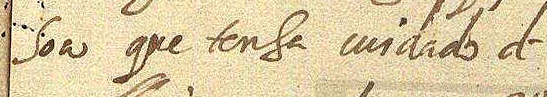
soa que tenha cuidado d̄
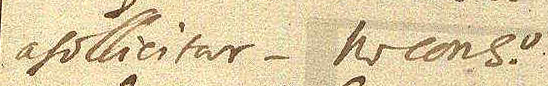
a sollicitar - no cons.o
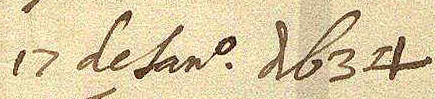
17 de Iano. de 634
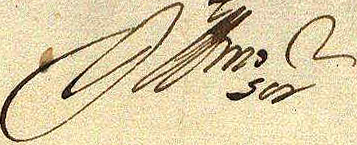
Jll.mo sor̄
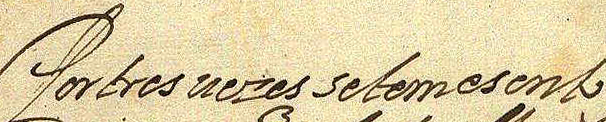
Por tres uezes se tem escrito
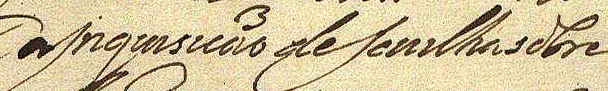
a Jnquisiçaõ de Seuilha sobre
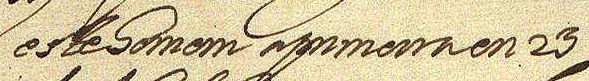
este homem a primeira en 23
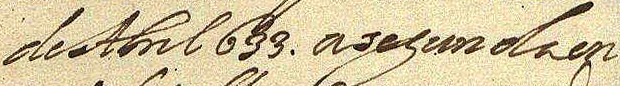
de Abril 633. a segunda en
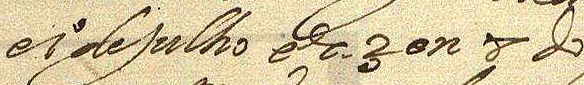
o 1o de Julho e a 3 en 8 do
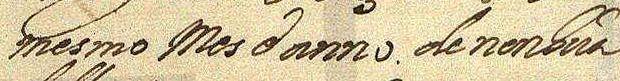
mesmo mes e anno de nenhuā
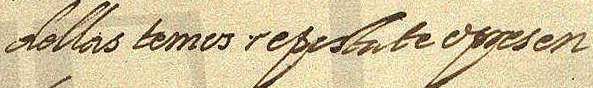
dellas temos reposta te o presen
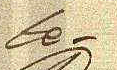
te -
